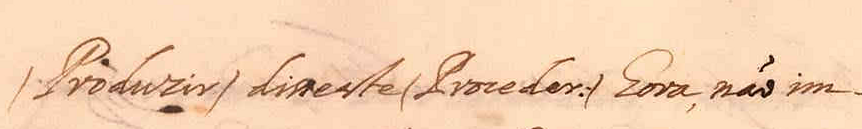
Produzir / disseste / Proceder / hora, não im
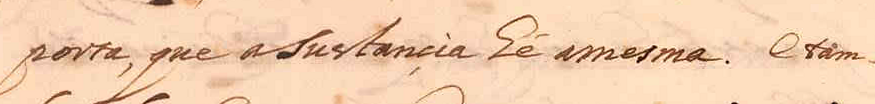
porta, que a sustancia hé a mesma. e tam
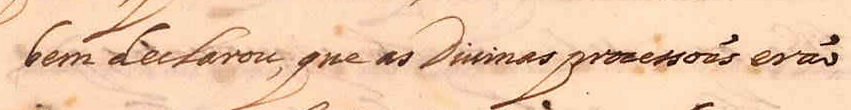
bem declarou, que as diuinas processoẽs eraõ
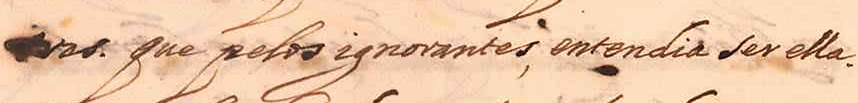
tres. que pelos ignorantes, entendia ser ella
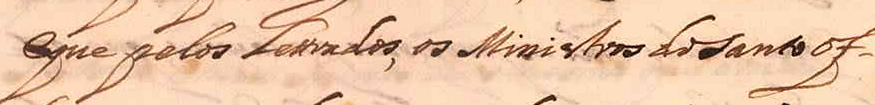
e que pelos Lettrados, os Ministros do santo of
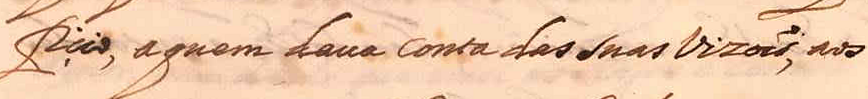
ficio, a quem daua conta das suas vizoẽs, aos
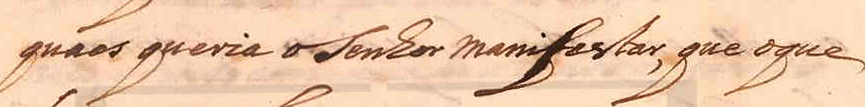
quaes queria o Senhor manifestar, que o que
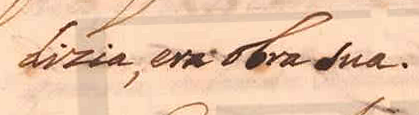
dizia, era obra sua.
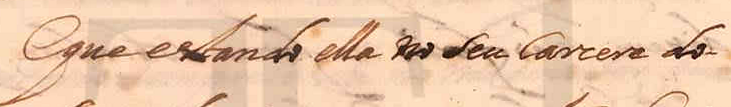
E que estando ella no seu carcere do
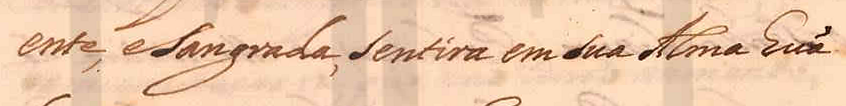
ente, e sangrada, sentira em sua Alma huā
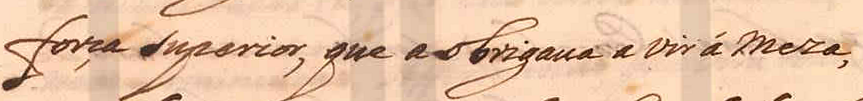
força superior, que a obrigaua a vir á Meza,
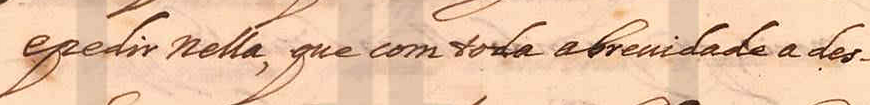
e pedir nella, que com toda a breuidade a des
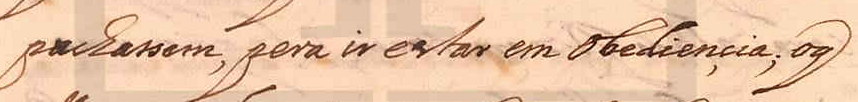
pachassem, pera ir estar em obediencia, o q̄
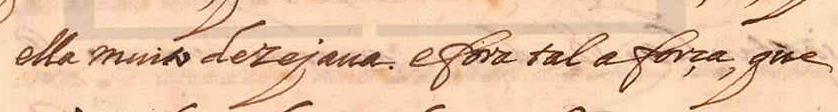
ella muito dezejaua. e fora tal a força, que
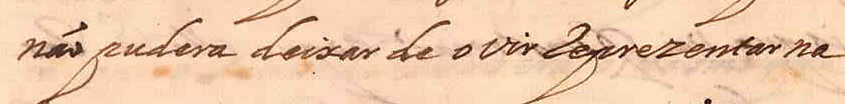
naõ pudera deixar de o vir Reprezentar na
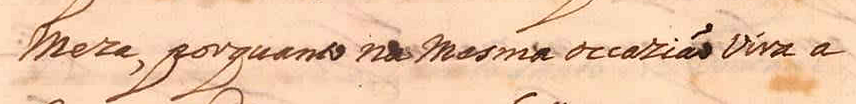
Meza, porquanto na mesma occaziaõ vira a
